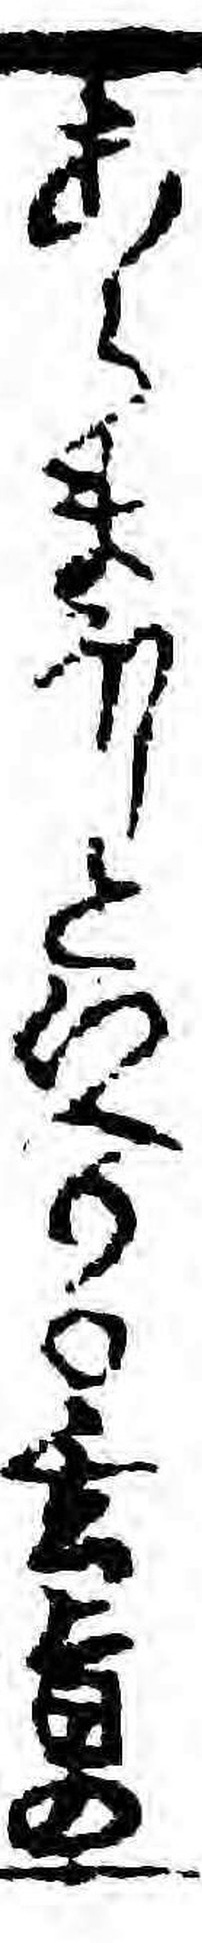あらまほしといへり〇玄旨の
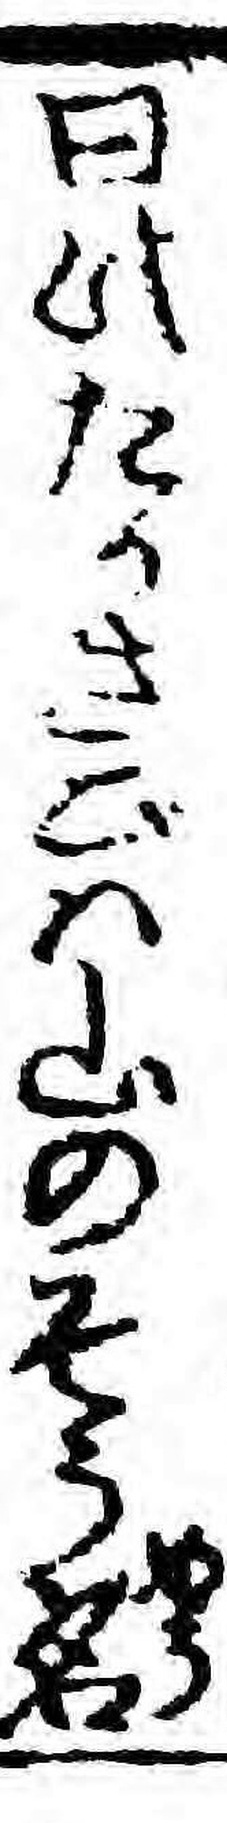曰此のたかさごは山のそう名
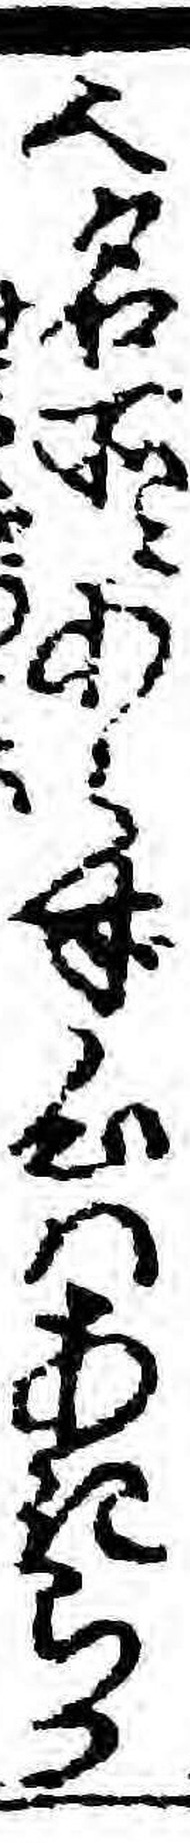也名所にあらす心はあきらか
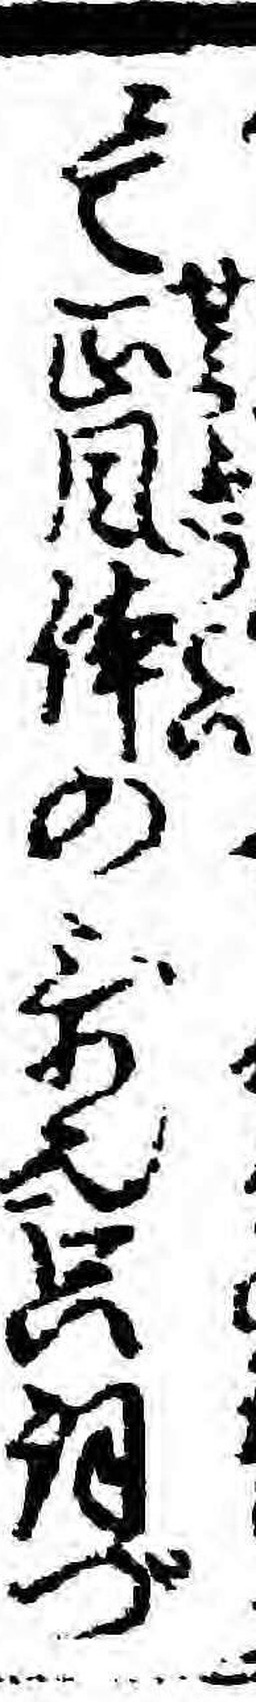にて正風体の哥也只詞づ
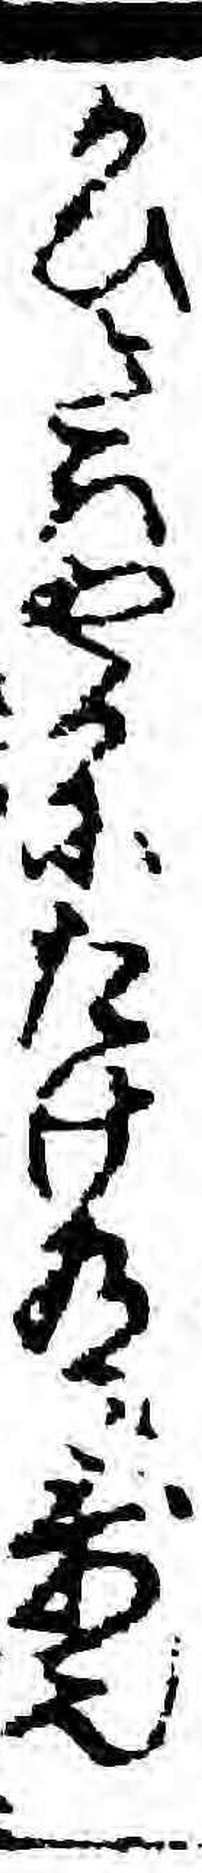かひさはやかにたけ有る哥也
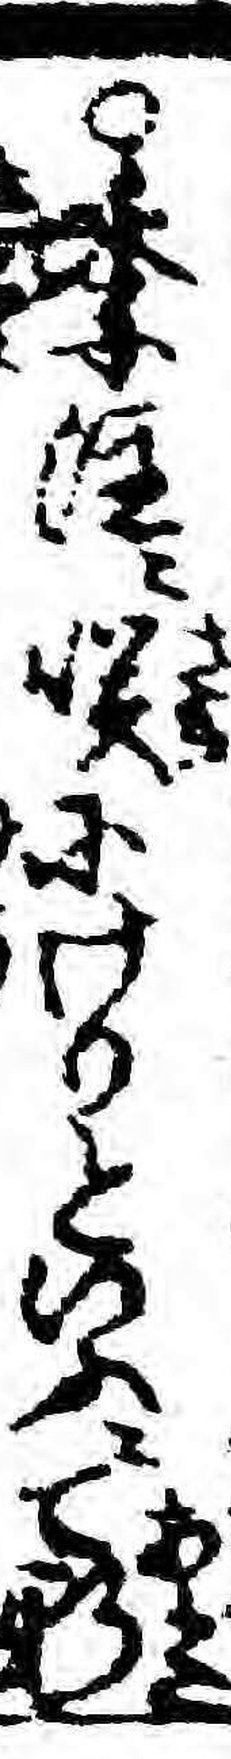〇季涯に咲にけりといふにて新
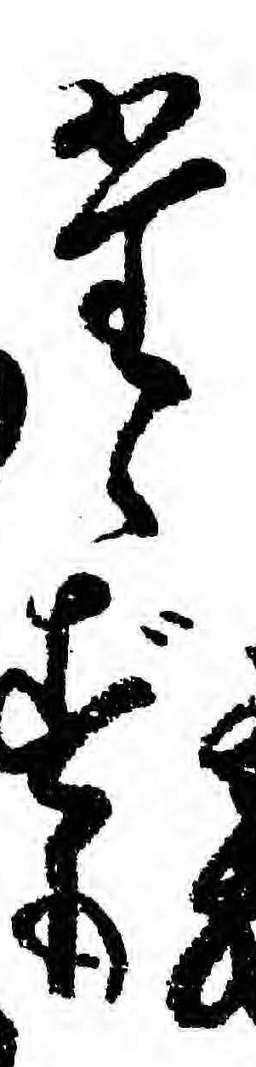たゝずも
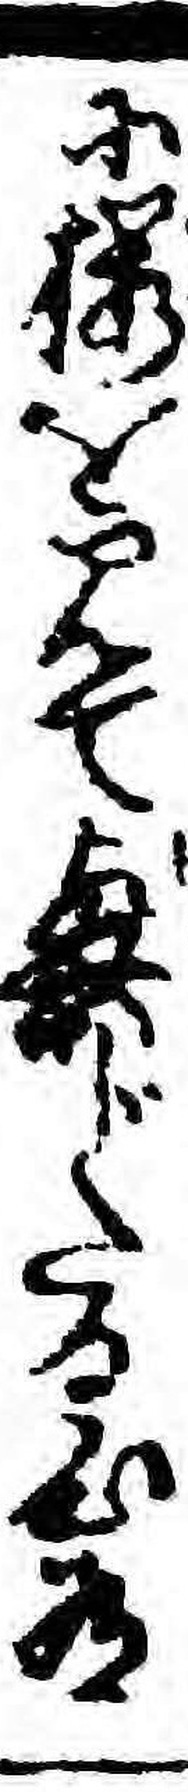に桜を見て興じたる心有
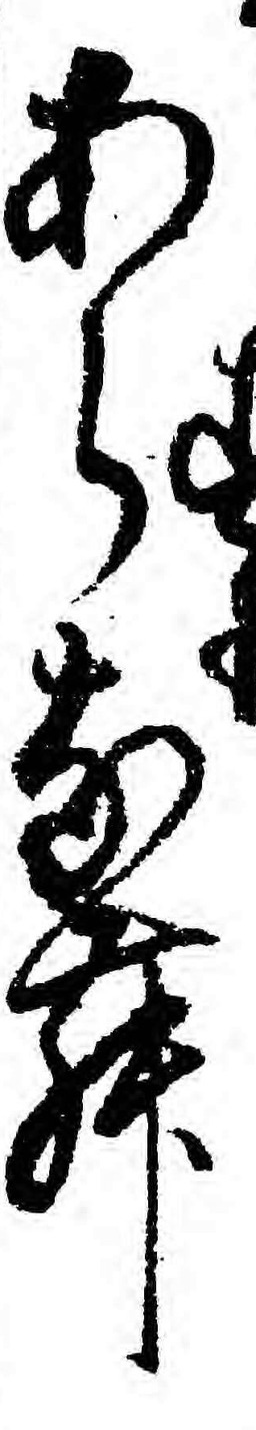あらなむ

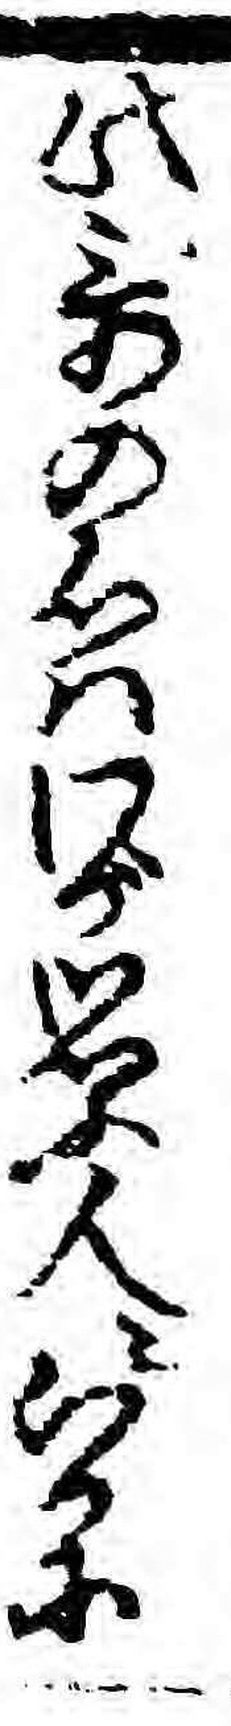此哥の心はわが思ふ人にいかに
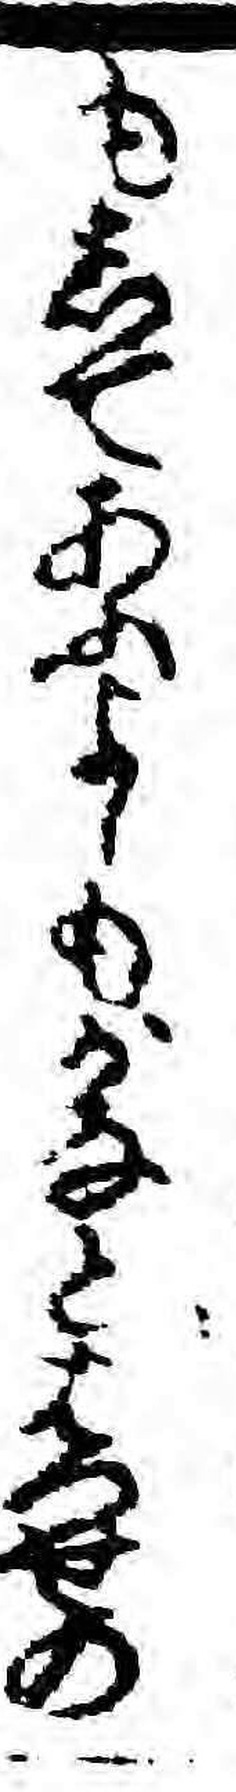もしてあふよしもがなとはつせの
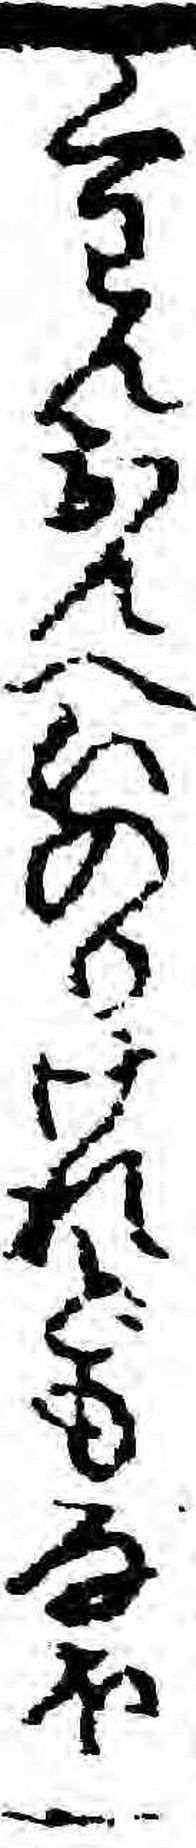くわんおんへいのりけれどもなほ
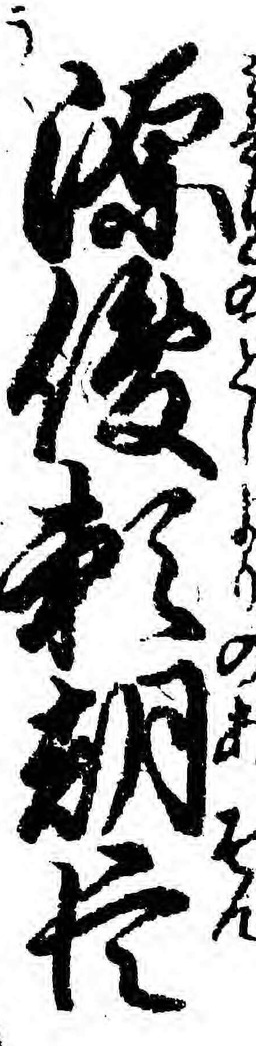源俊頼朝臣
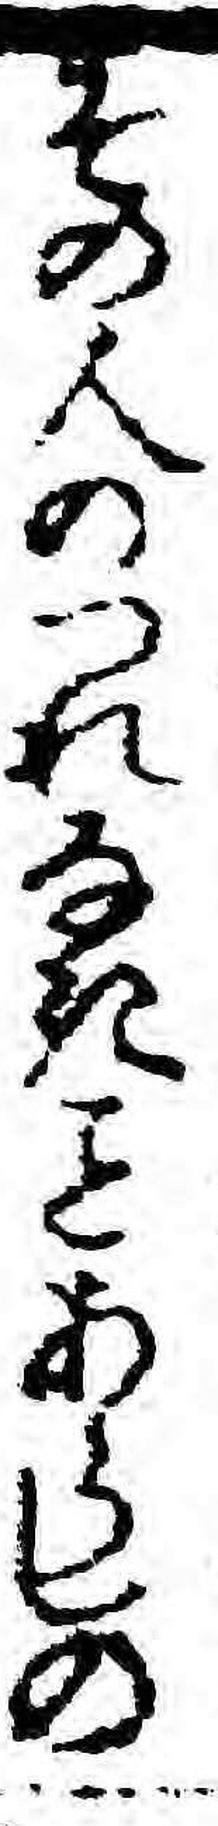そのひとのつれなきことあらしの
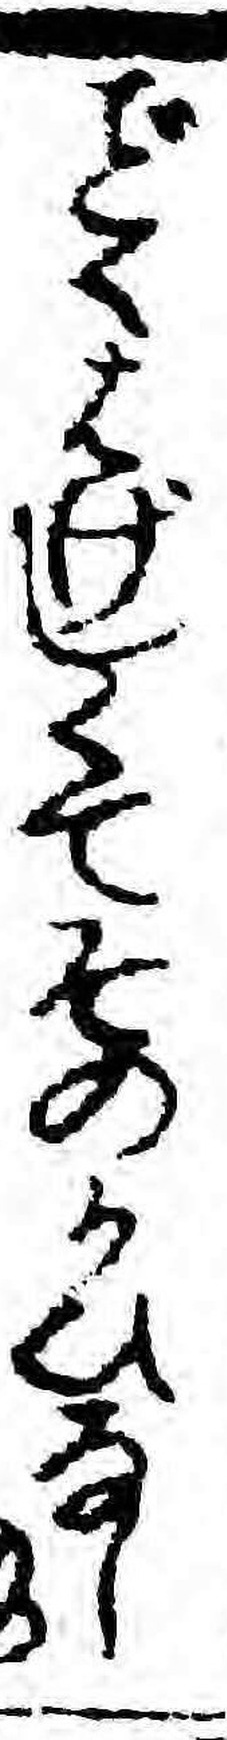ごとくはげしくてそのかひなし
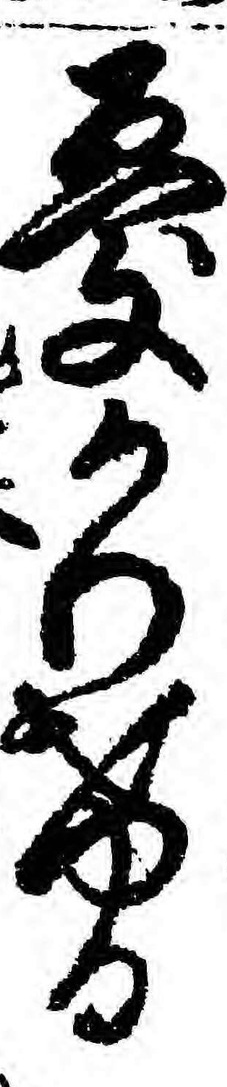憂かりける
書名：頭書和歌注譯／壽賀多百人一首小倉錦
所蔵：国文学研究資料館
